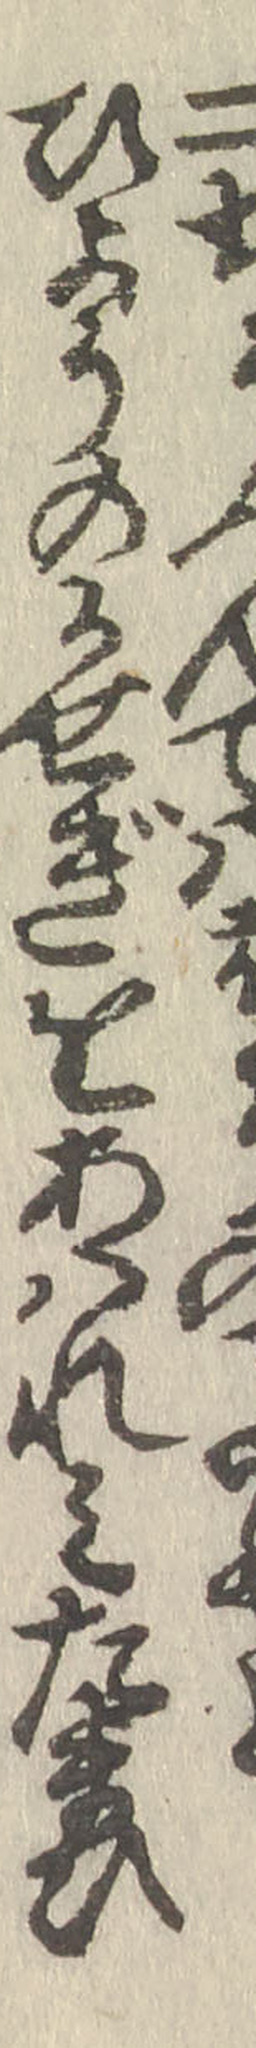ひようのかせぎをあはれみたまひ
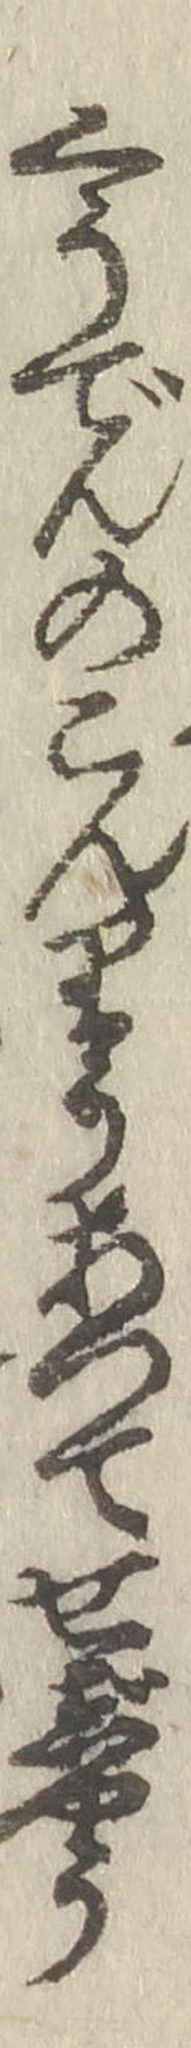くうでんのこんりうあつてせじやう
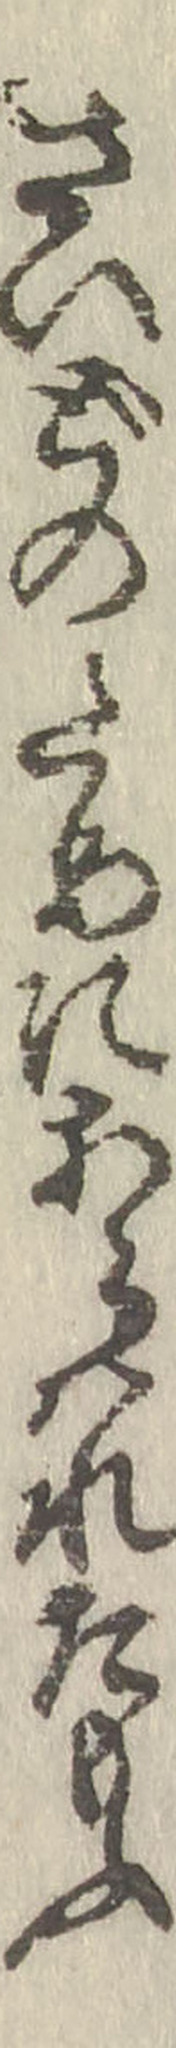さいどのためにあらはれたもふ
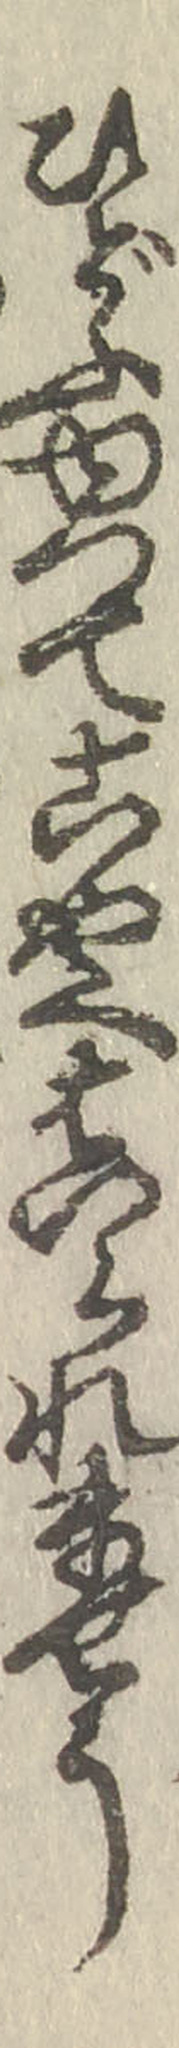ひどふゆつてこやへはいられませう
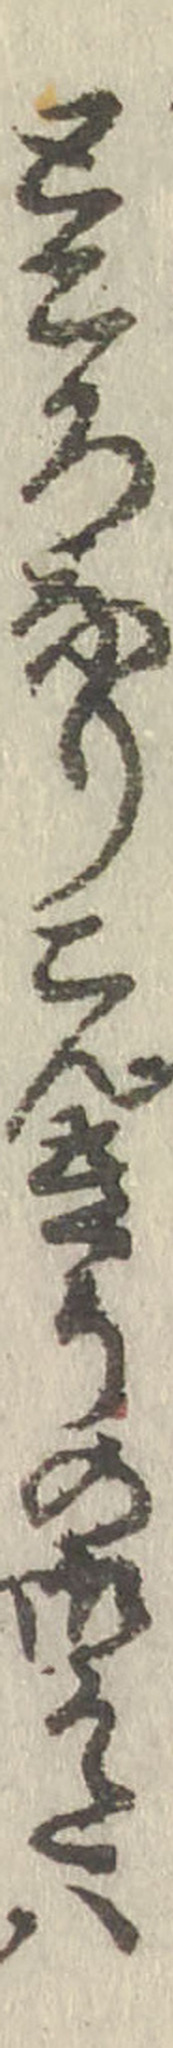ところなりこんきうのおかたは
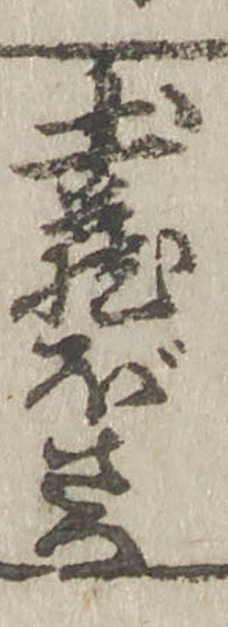土蔵ぼさつ
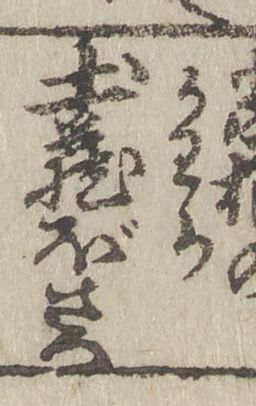土蔵ぼさつ
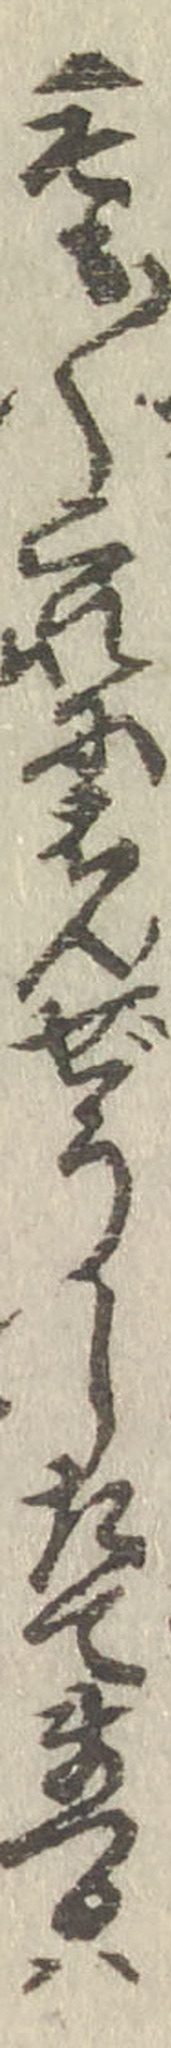▲そも〳〵これにはんぜうしたてまつるは
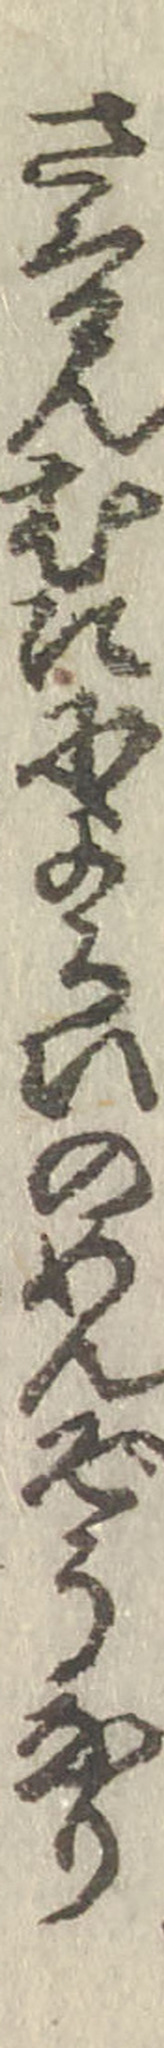さくわんむにによらいのめんぞうなり
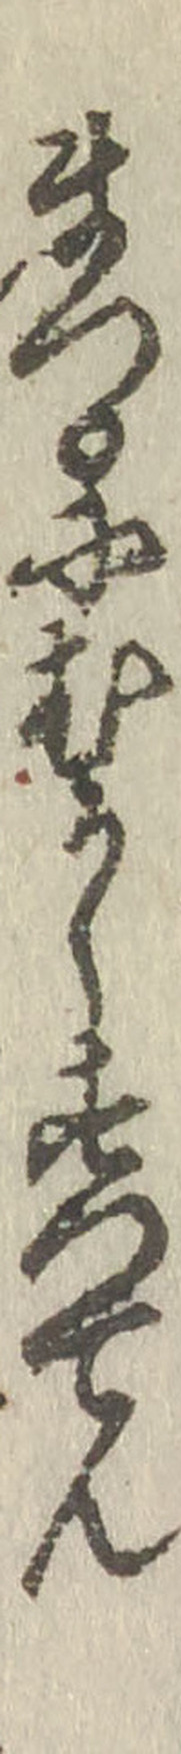まつるにむかしすつてん
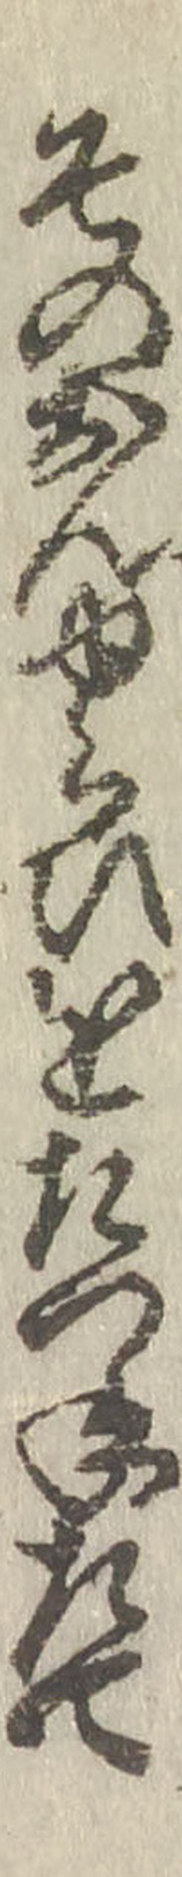そのおんゆらひをたつねたて
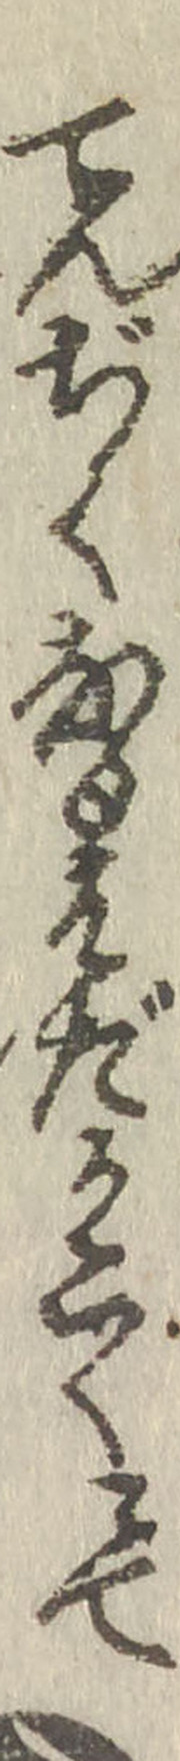てんぢくなるはだかこくにて
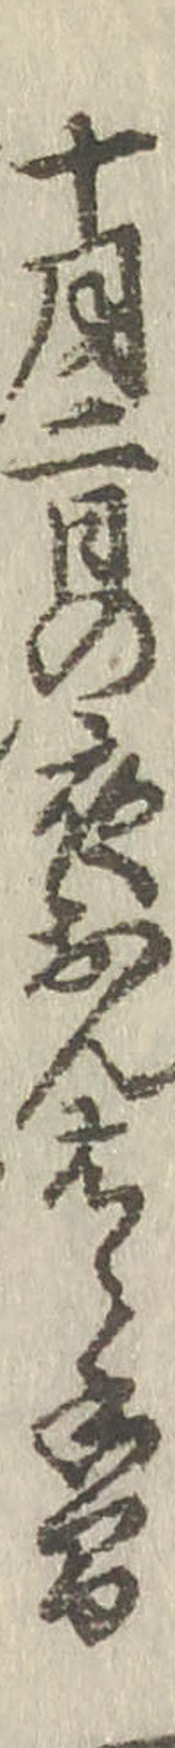十月二日の夜おんは手間
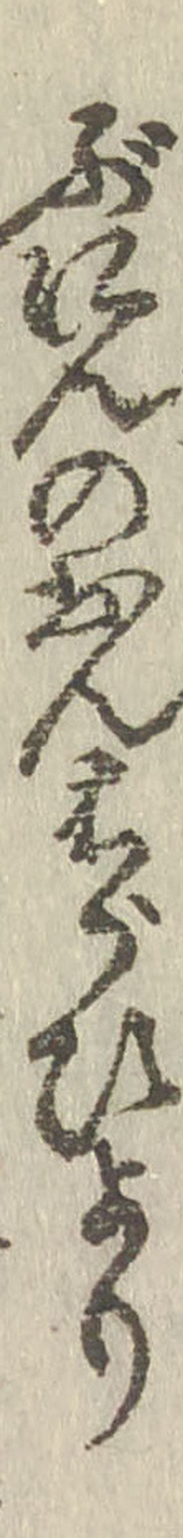ぶにんのおんはらひより
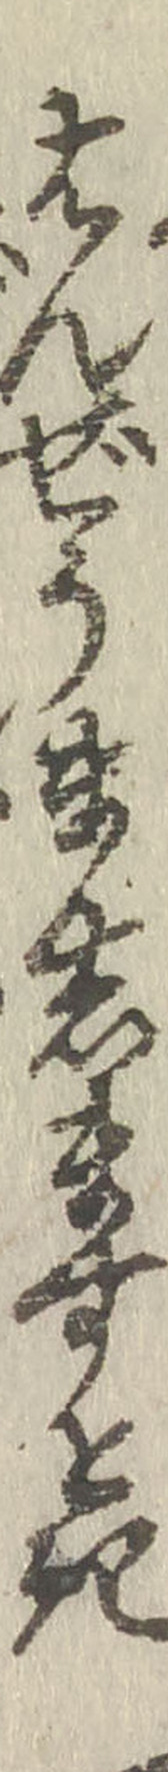はんぜうましますとき
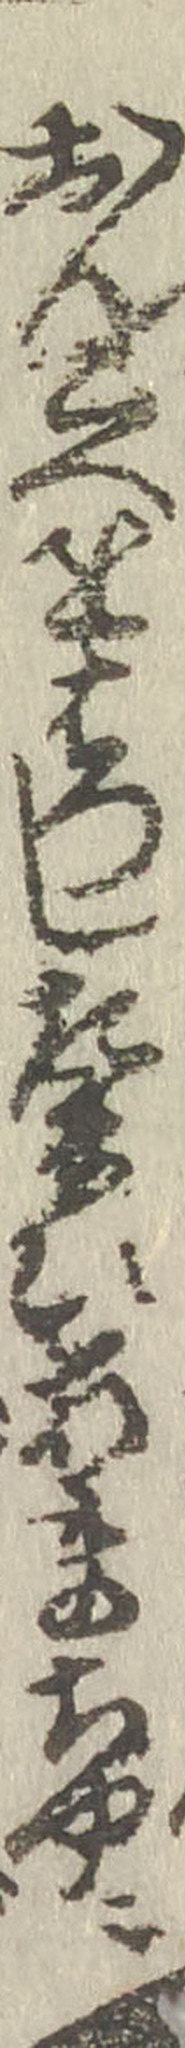おんこへをはつしたまひあまちやに
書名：左官無二如来家根之瓦土蔵菩薩開帳由来記
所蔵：東京大学総合図書館 General Library in the University of Tokyo, JAPAN
